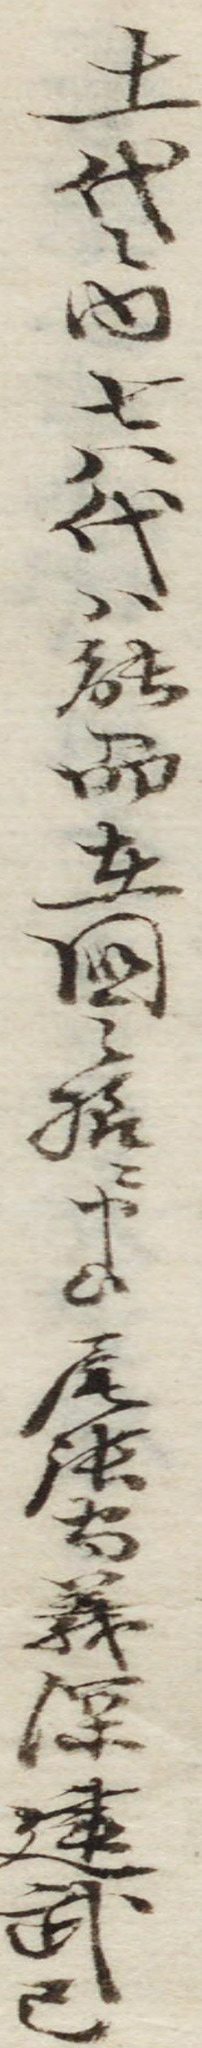十一代之内七八代は能而在国之様に申候尾張守義深建武巳
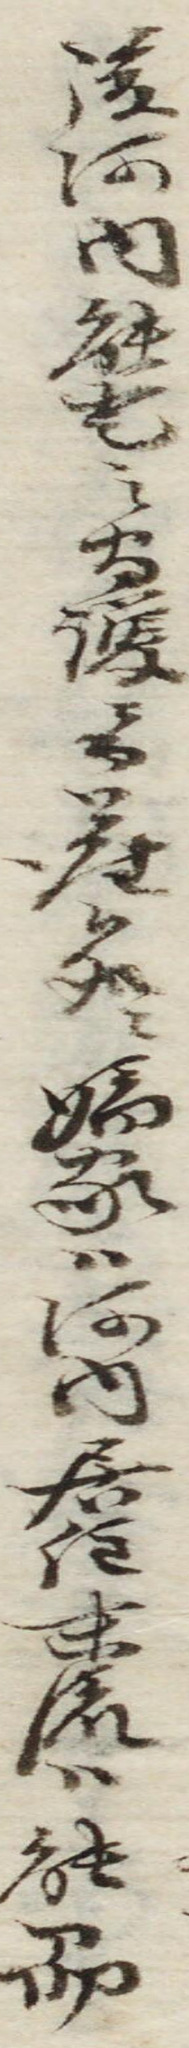後河内能登之守護に而御座候処に嫡家は河内居住末流は能州
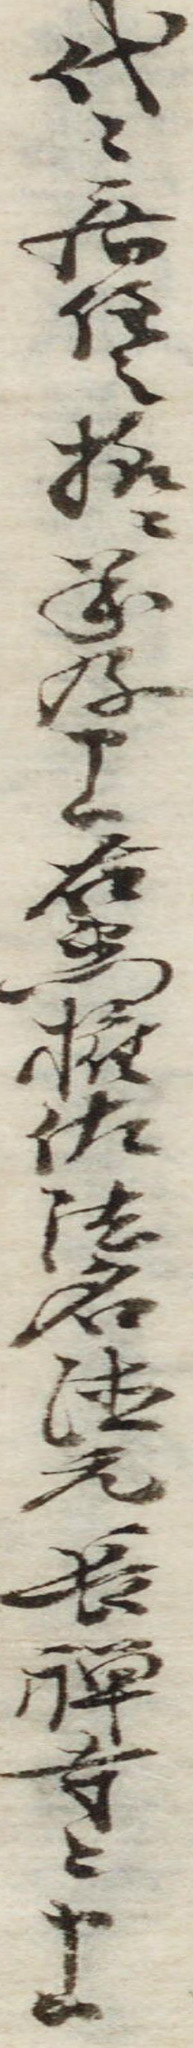代々居住之様に承及申候右衛門権佐法名徳元長禅寺と申候
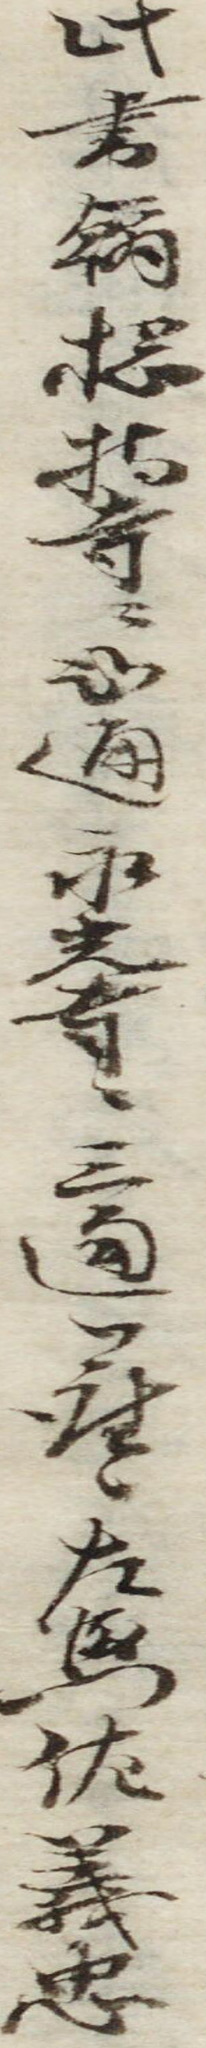此書翰惣持寺に弐通永光寺に三通御座候左衛門佐義忠
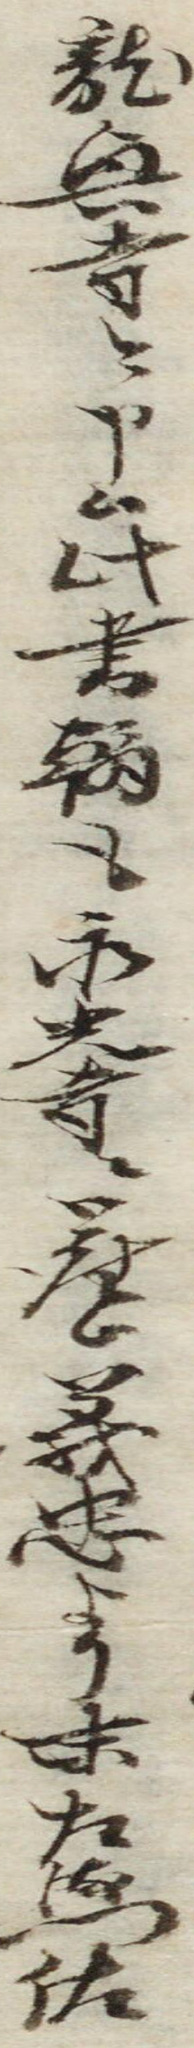龍興寺と申候此書翰も永光寺に御座候義忠より末左衛門佐
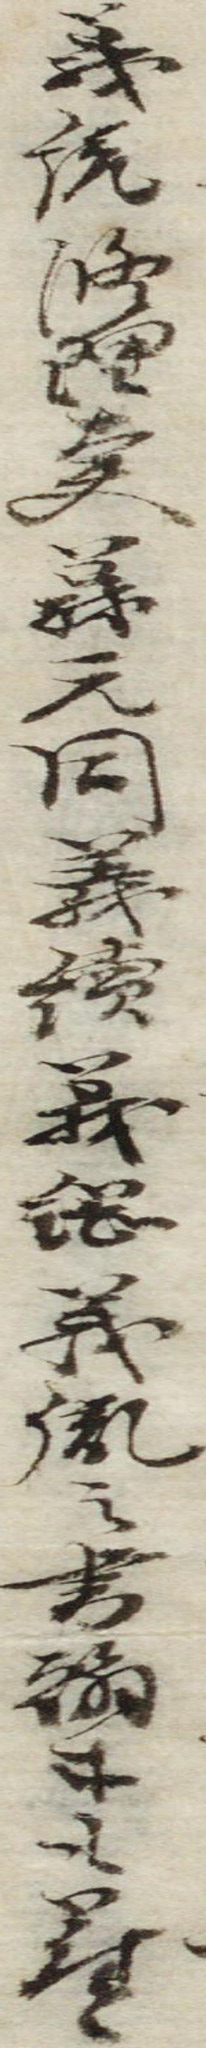義統修理大夫義元同義続義綱義胤之書翰等も御座候
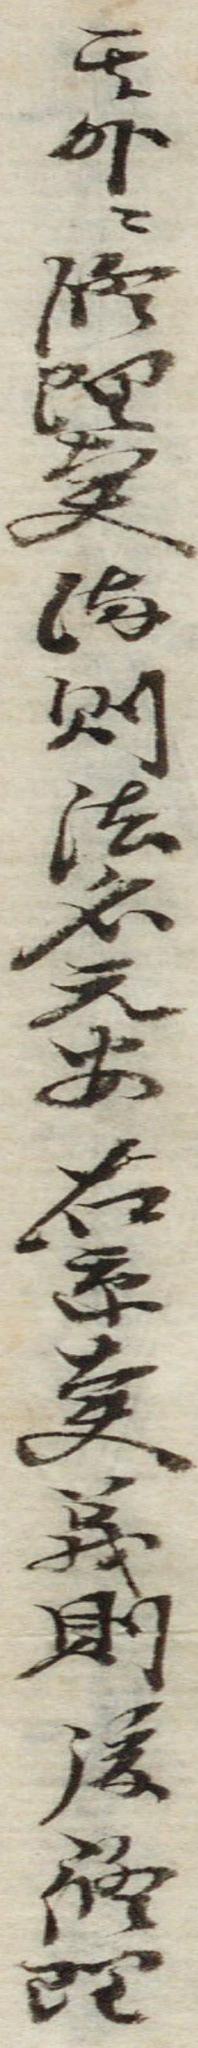其外に修理大夫満則法名元安右京大夫義則後修理総

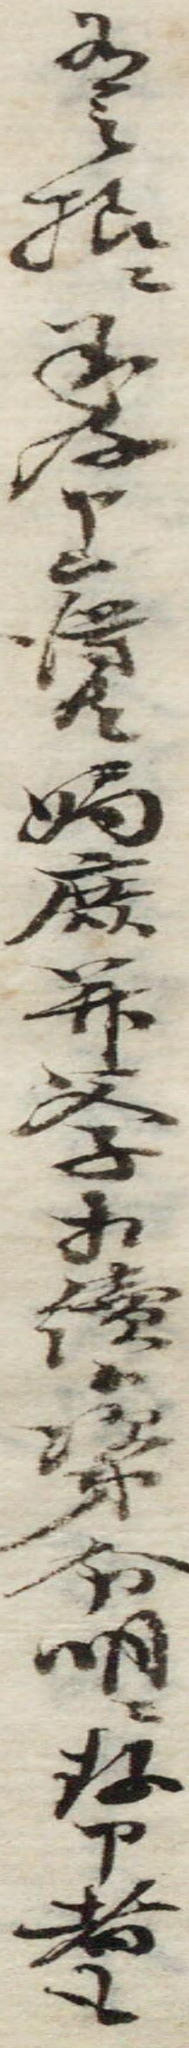有之様に承及申候得共嫡庶并父子相続候次第分明に致申者も
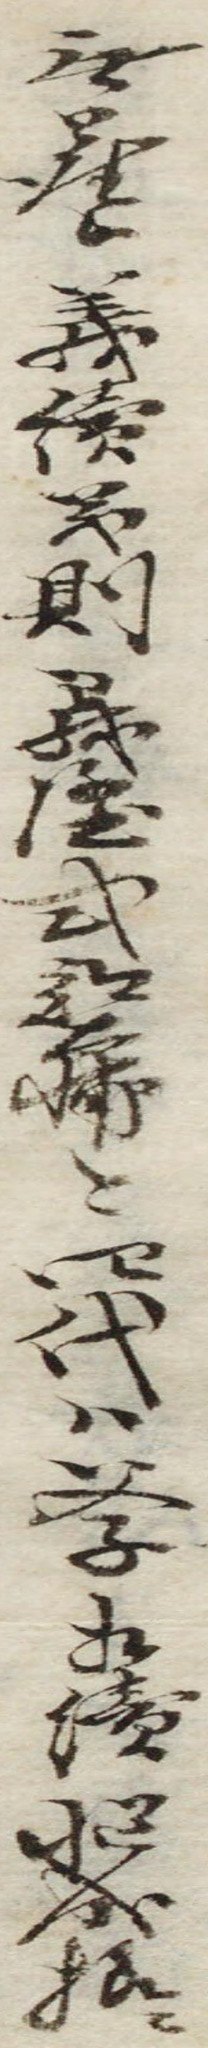無御座候義続義則義隆式部大輔と四代は父子相続慥成様に
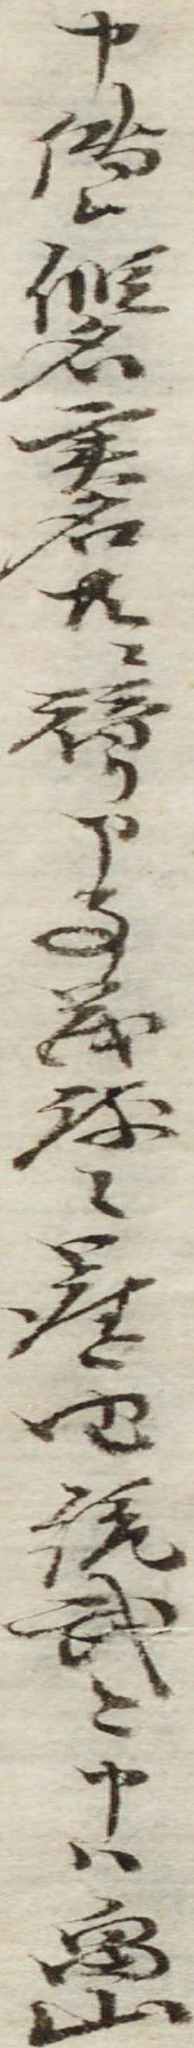申伝候假名実名共に替り申事も度々御座候由統武と申は畠山
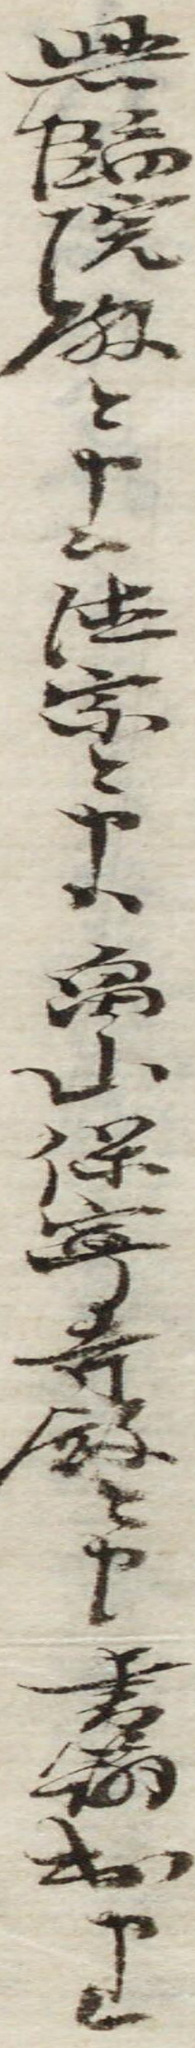興臨院殿と申候徳宗と申は畠山保亭寺殿と申候書翰出申候
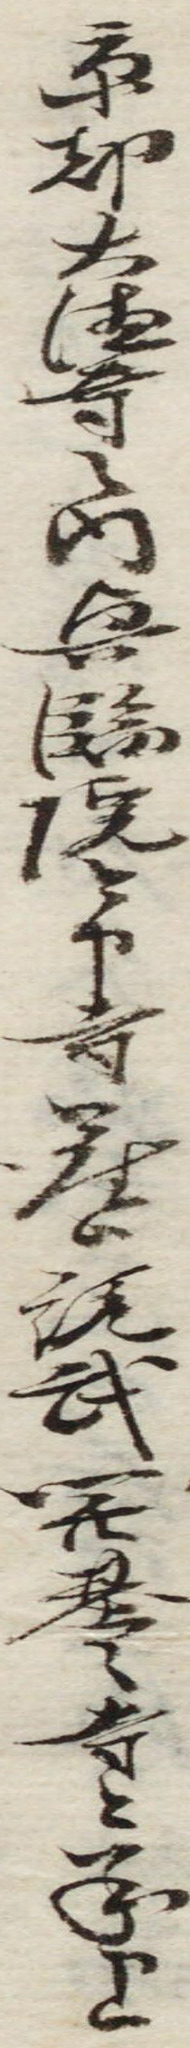京都大徳寺之内興倫臨院と申寺御座候統武開基之寺と承申候
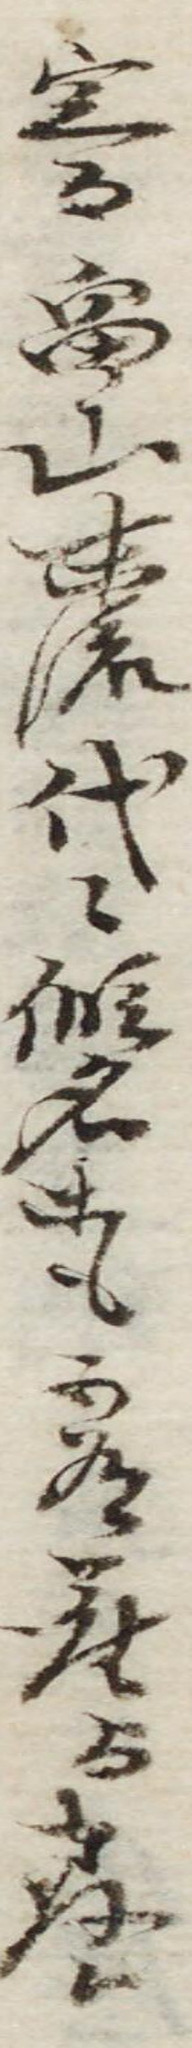定而畠山末流代々假名等も可有御座与奉存候
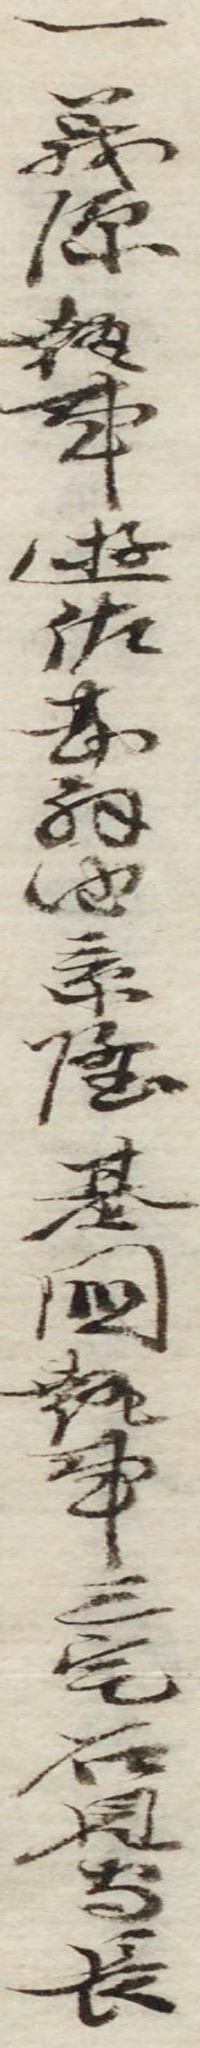一義深執事遊佐勘解由景隆基国執事三宅石見守長
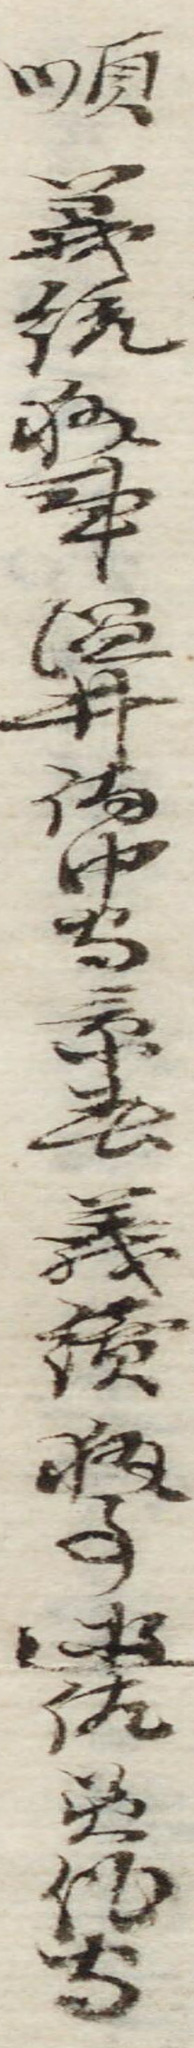順義統執事温井備中守景春義続執事遊佐美作守
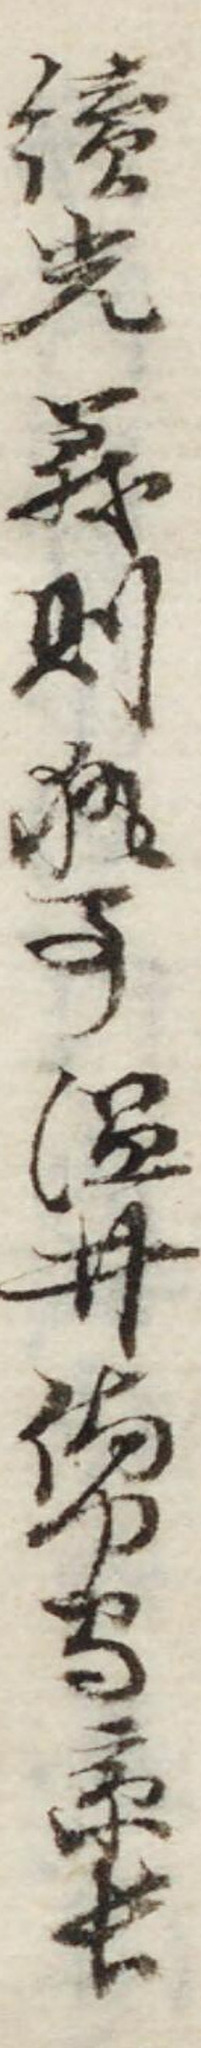続光義則執事温井備中守景長
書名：古老紀談等
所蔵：Ishikawa Prefectural Library
